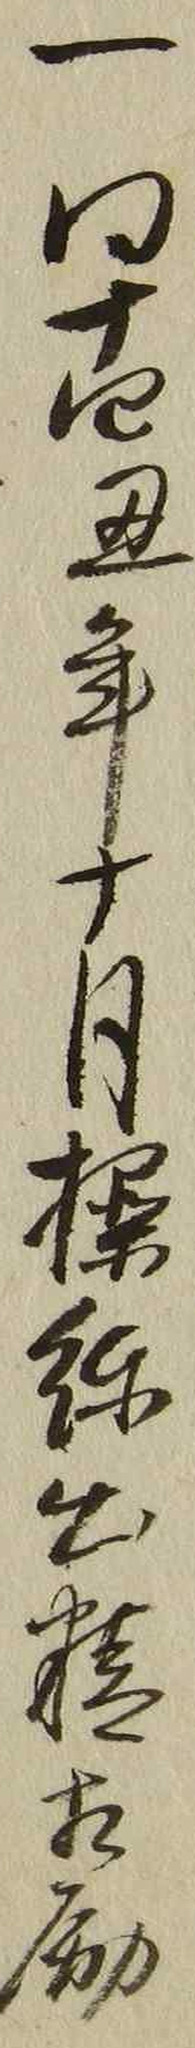一同十四丑年十月操練出精相励
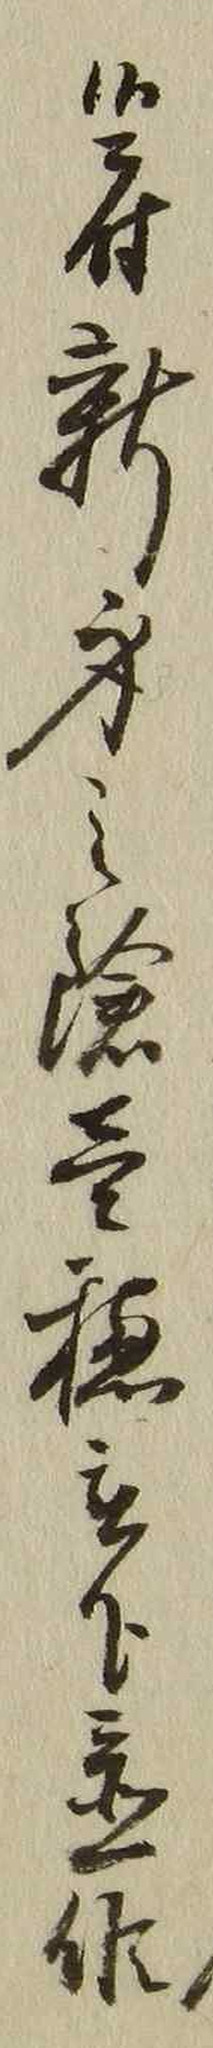候ニ付新身之鎗壱穂被下置候
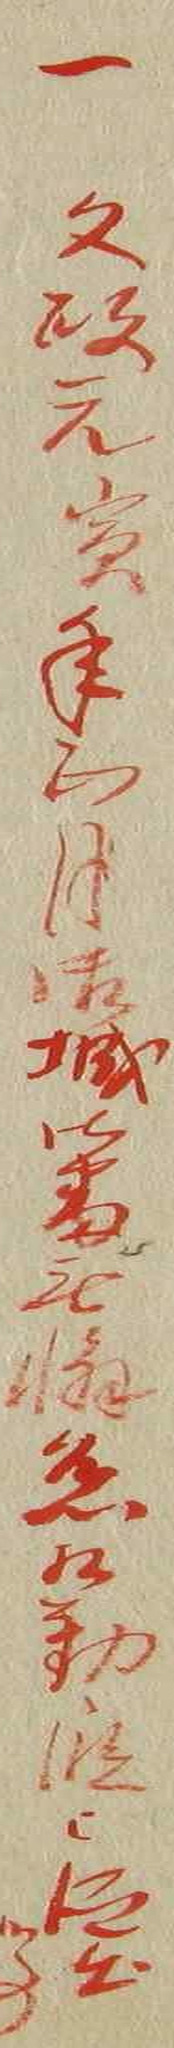一文政元寅年正月御城御番無懈怠相勤候段被仰出候事
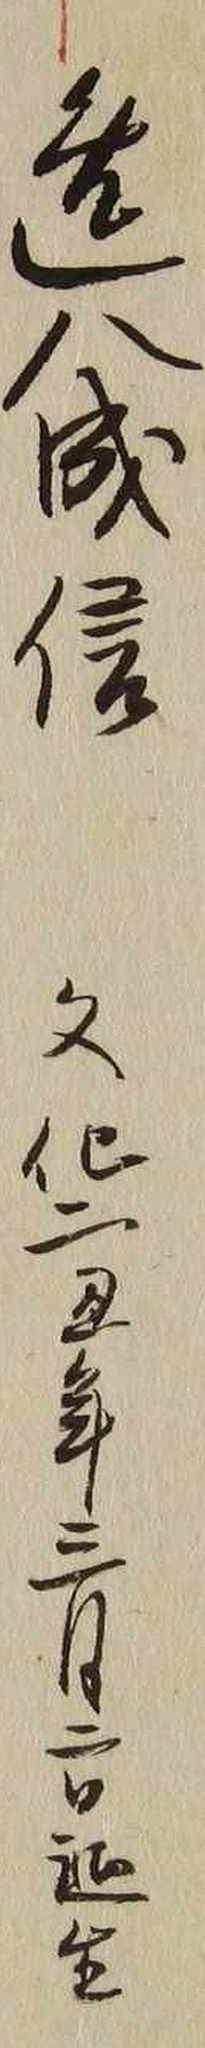逸八成信文化二丑年三月二日誕生
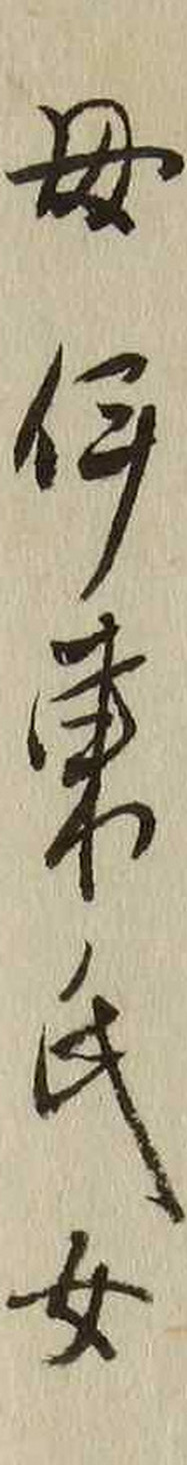母伊東氏女
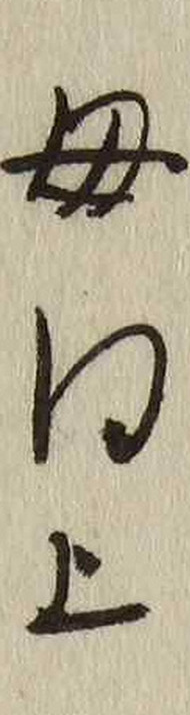母同上

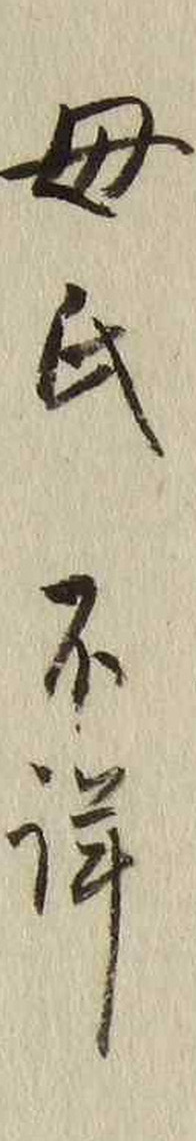母氏不詳
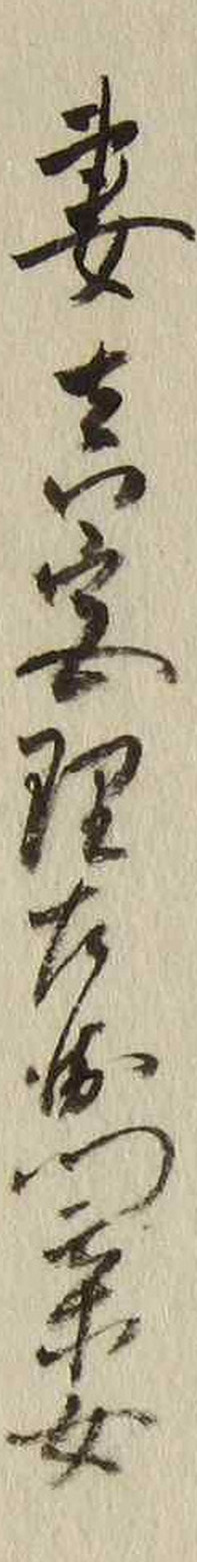妻真宮理左衛門某女
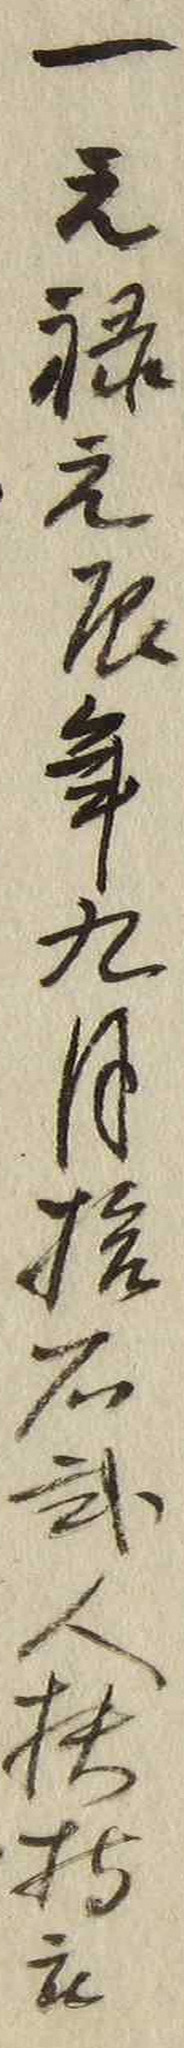一元禄元辰年九月拾石弐人扶持被
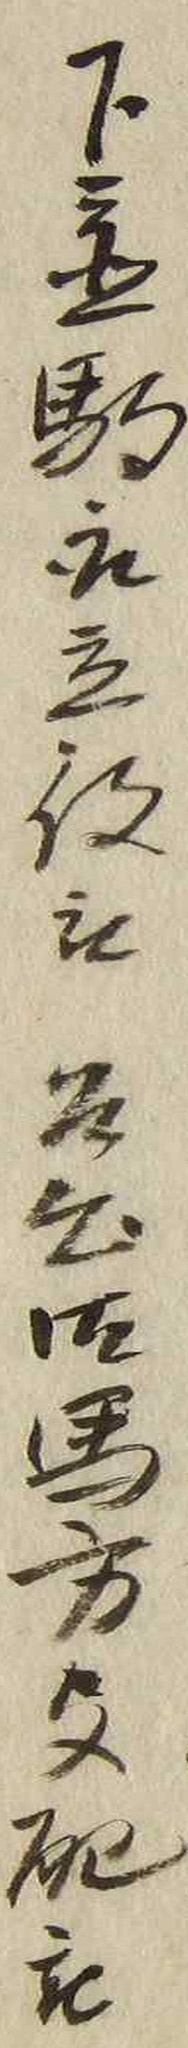下置駒取立役被召出御馬方支配被

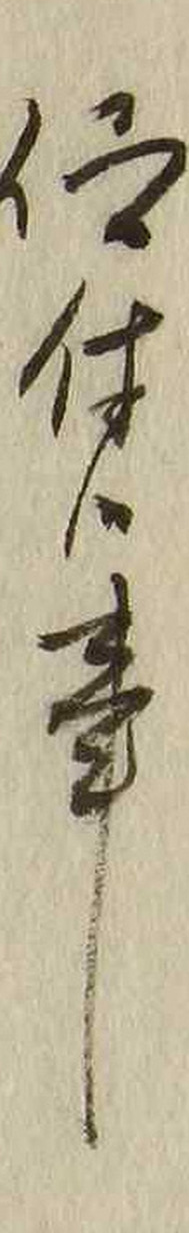仰付候事
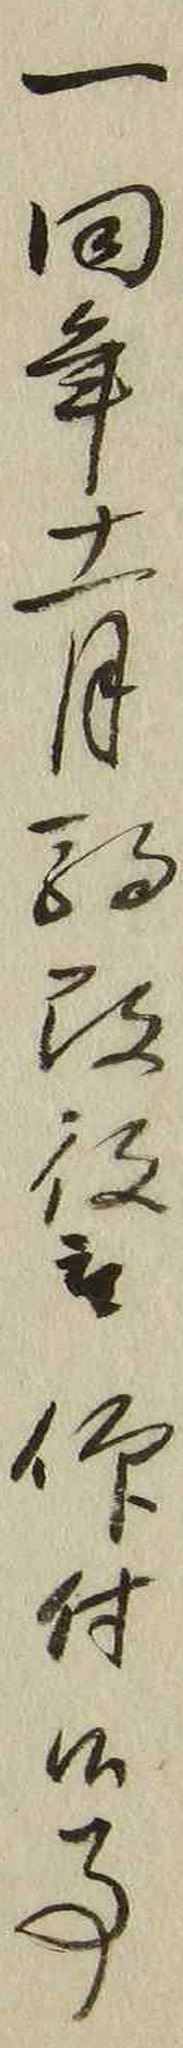一同年十一月駒改役被仰付候事
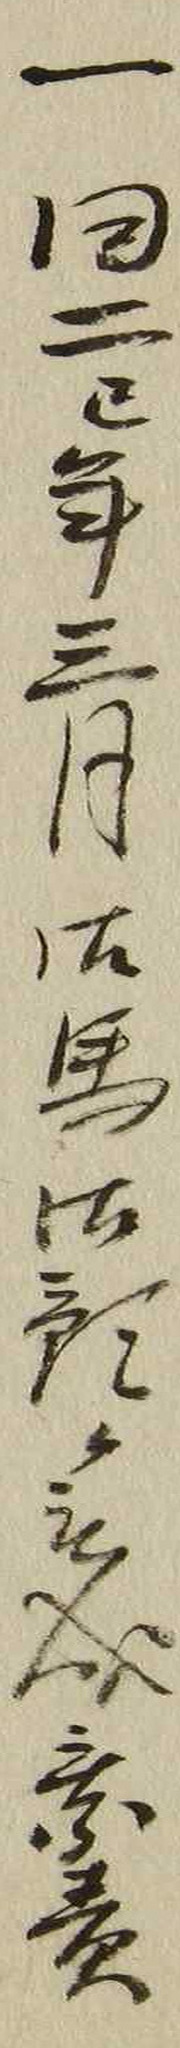一同二巳年三月御馬御預ケ被成乗責
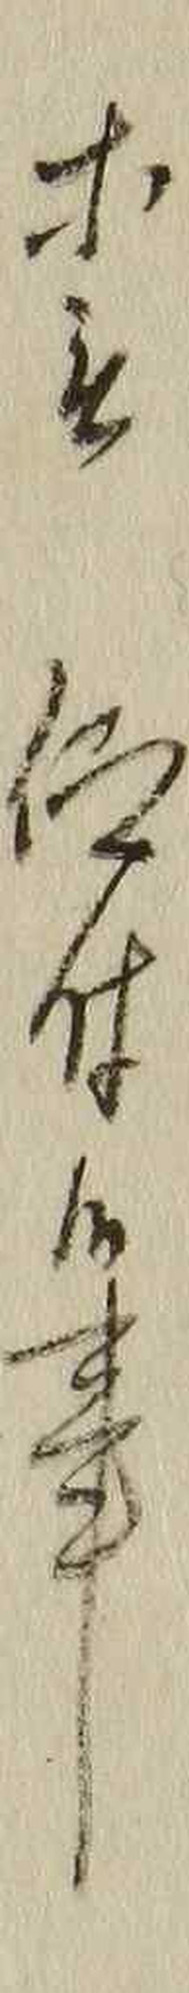等被仰付候事
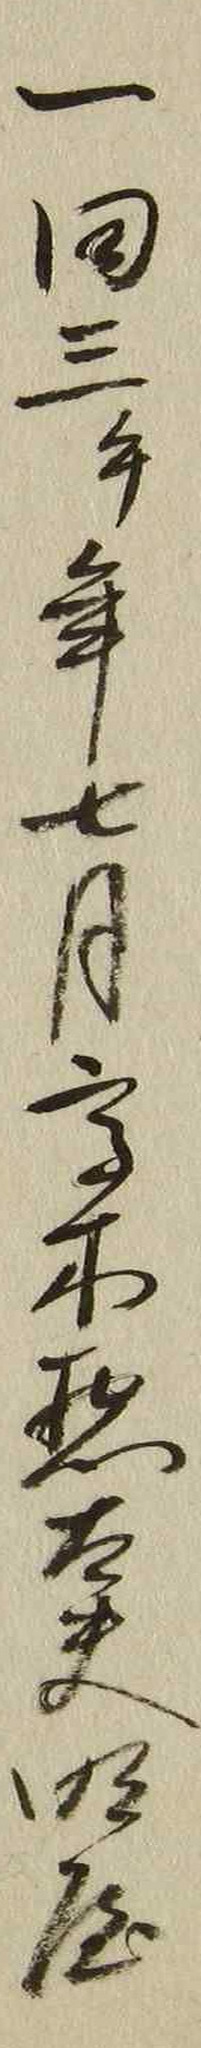一同三午年七月高木惣太夫明屋
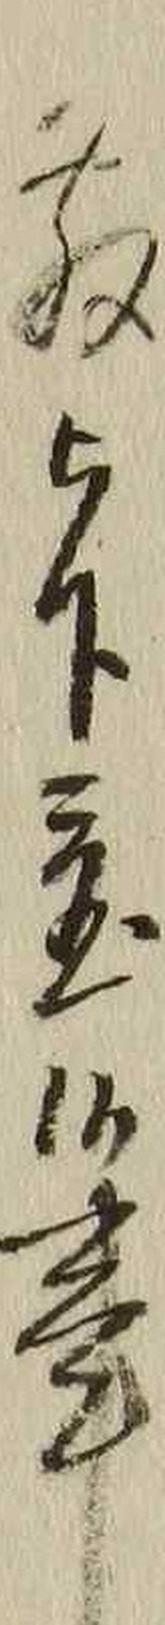敷被下置候事
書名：諸士系譜　巻之359　す之部9
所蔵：会津若松市立会津図書館
